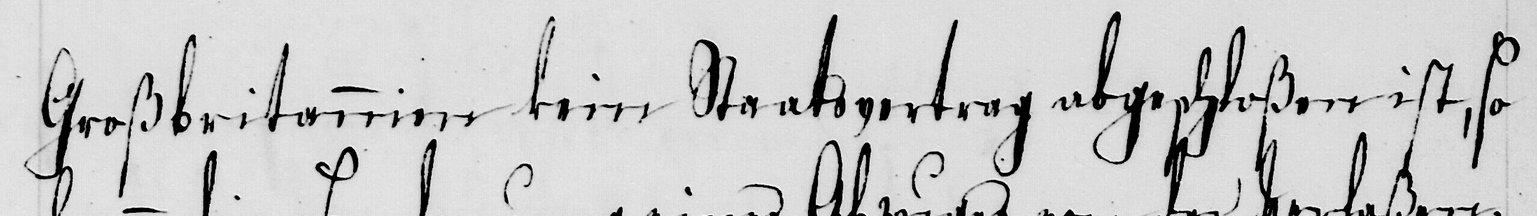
Großbritannien kein Staatsvertrag abgeschloßen ist, so
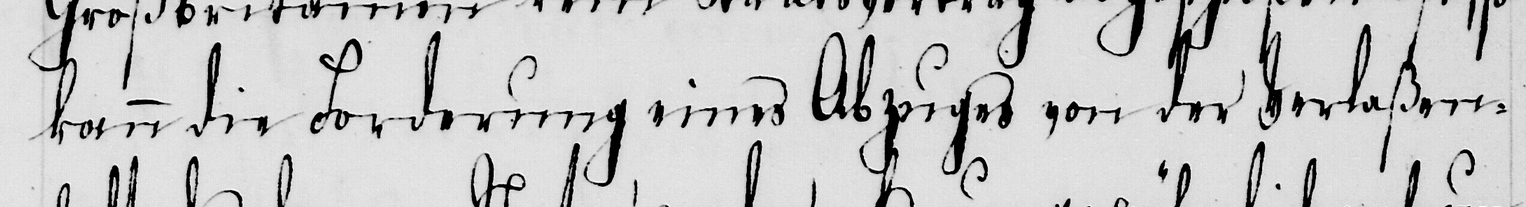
kann die Forderung eines Abzuges von der Verlaßen¬
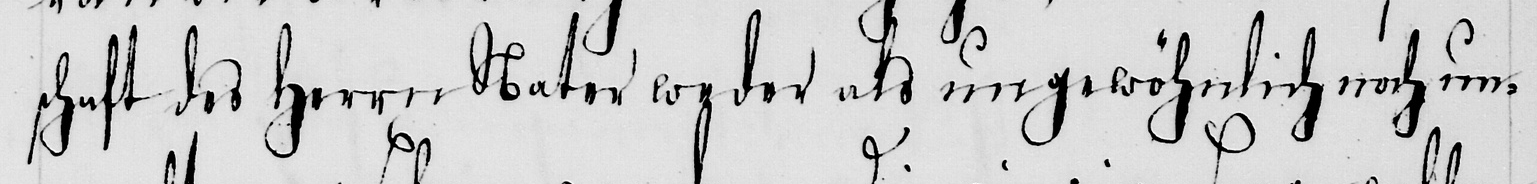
schaft des Herrn Nater weder als ungewöhnlich noch un¬
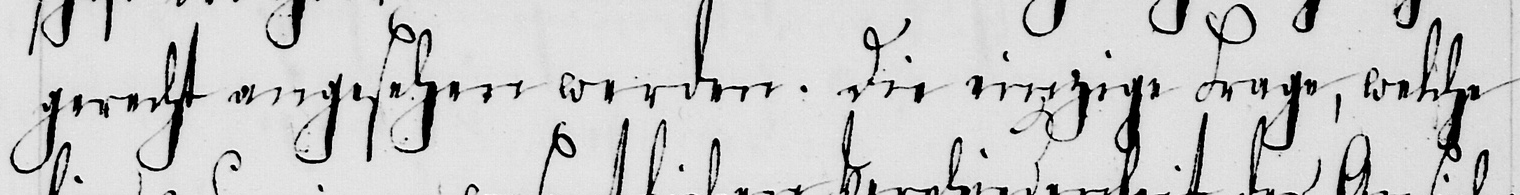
gerecht angesehen werden. Die einzige Frage, welche
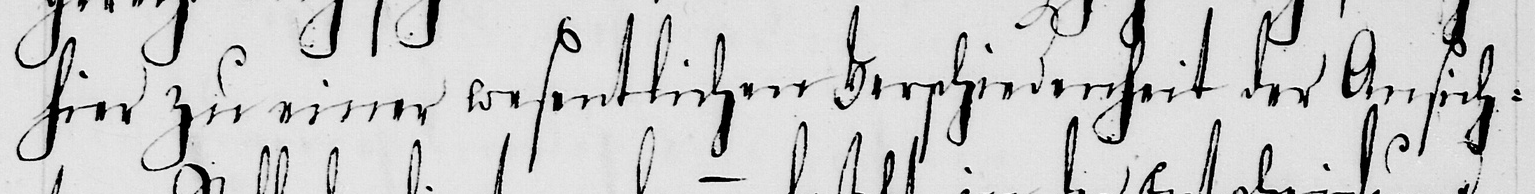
hier zu einer wesentlichen Verschiedenheit der Ansich¬
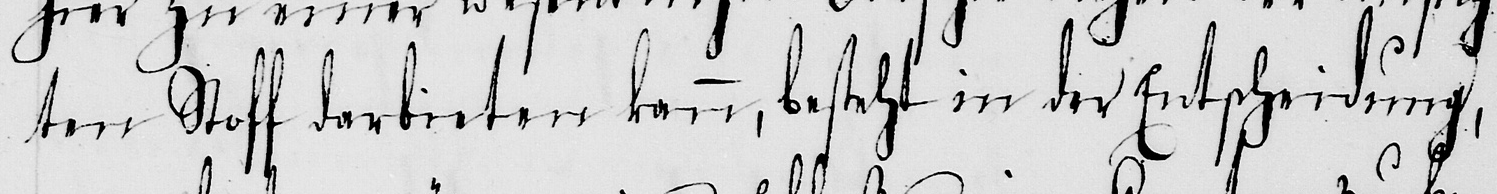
ten Stoff darbieten kann, besteht in der Entscheidung,
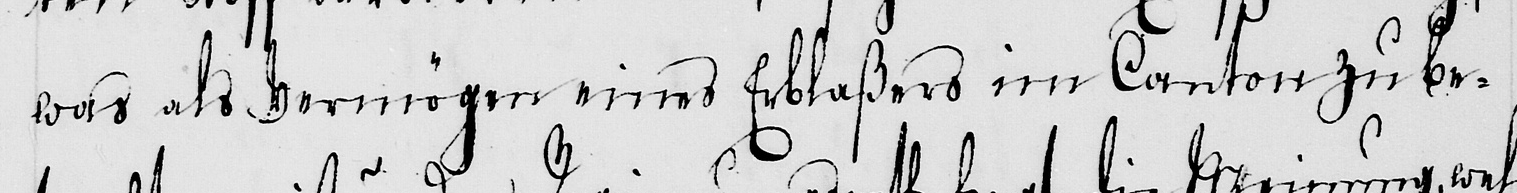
was als Vermögen eines Erblaßers im Canton zu be¬
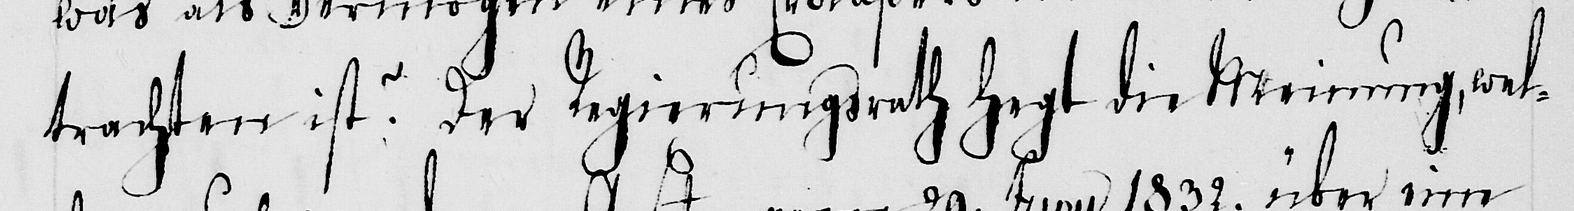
trachten ist? Der Regierungsrath hegt die Meinung, wel¬
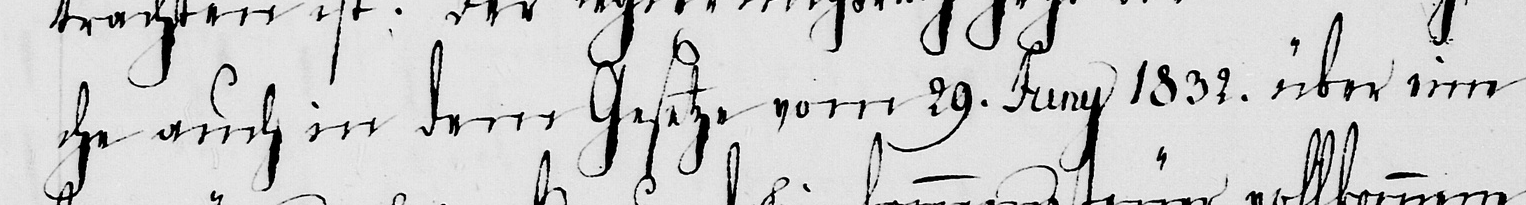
che auch in dem Gesetze vom 29. Juny 1832. über eine
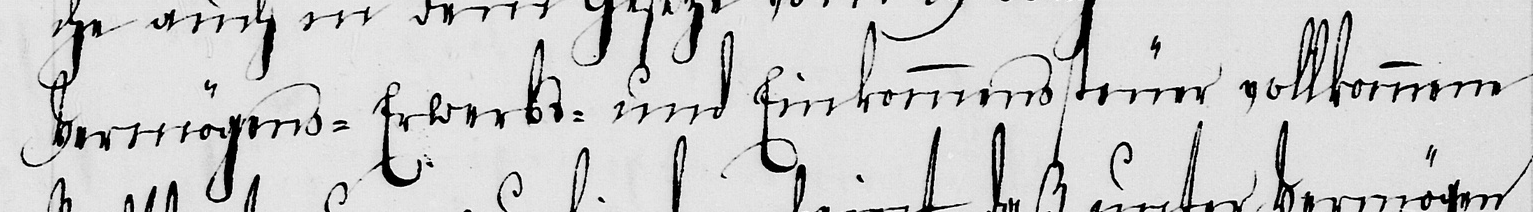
Vermögens- Erwerbs- und Einkommenssteuer vollkommene
